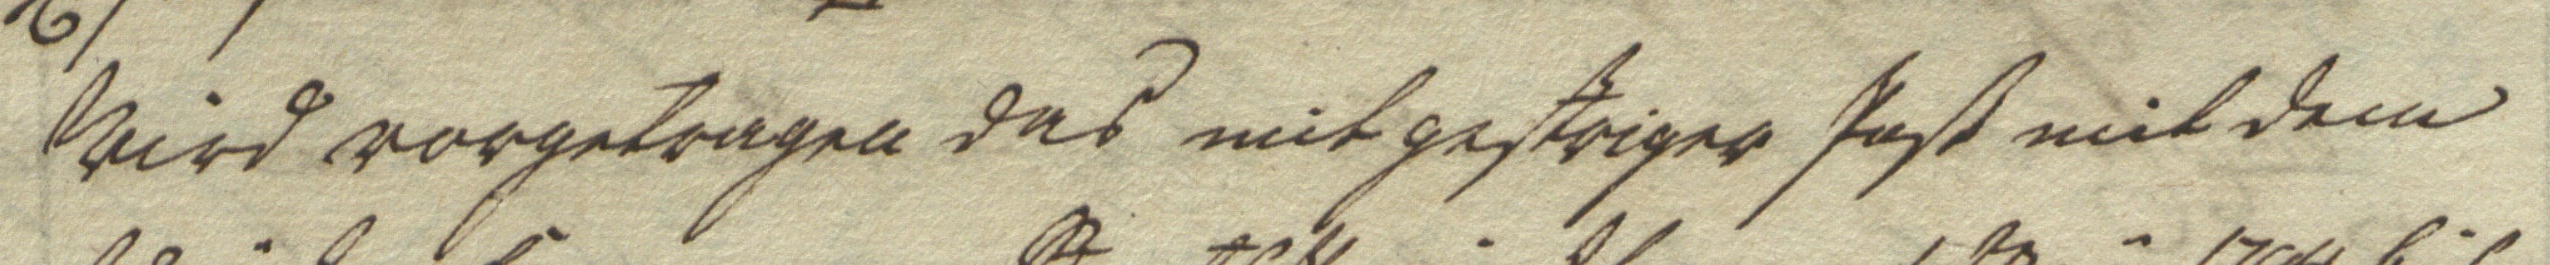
Wird vorgetragen das mit gestriger Post mit dem
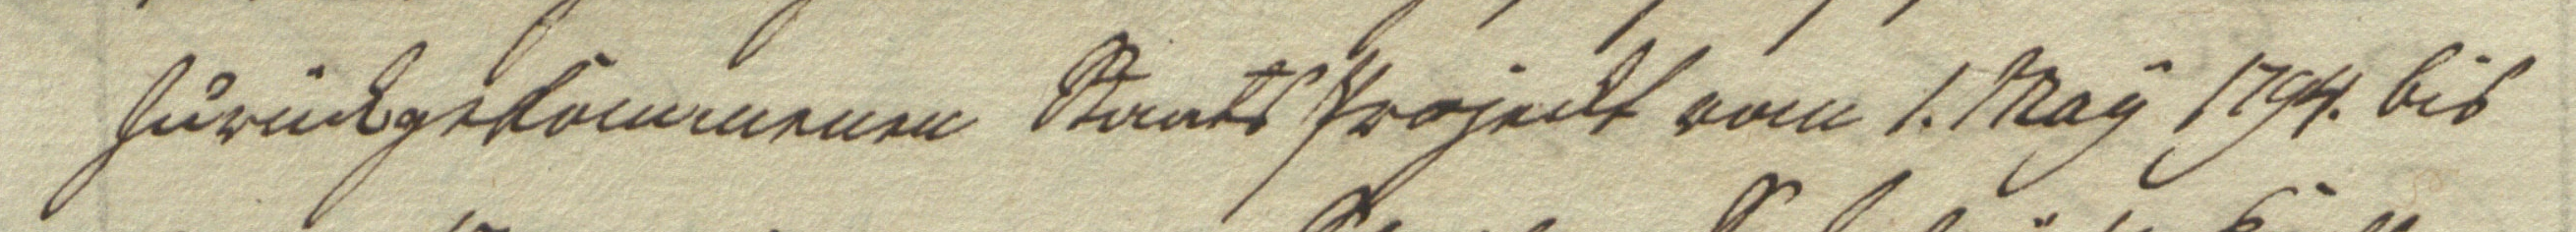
zurückgekommenen Staats Projekt vom 1. May 1794. bis
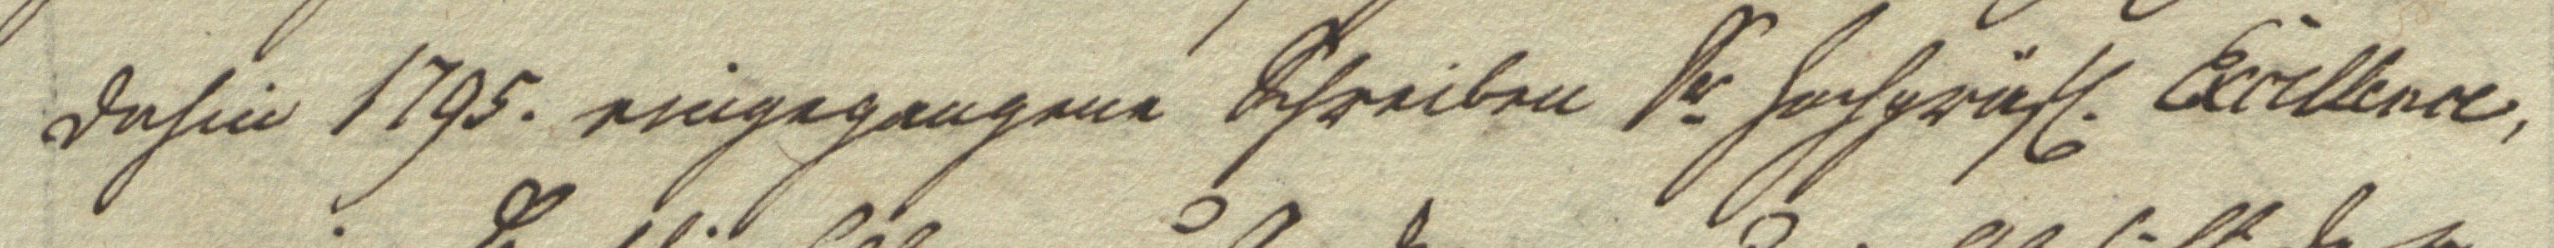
dahin 1795. eingegangene Schreiben Sr. Hochgräfl. Excellence,
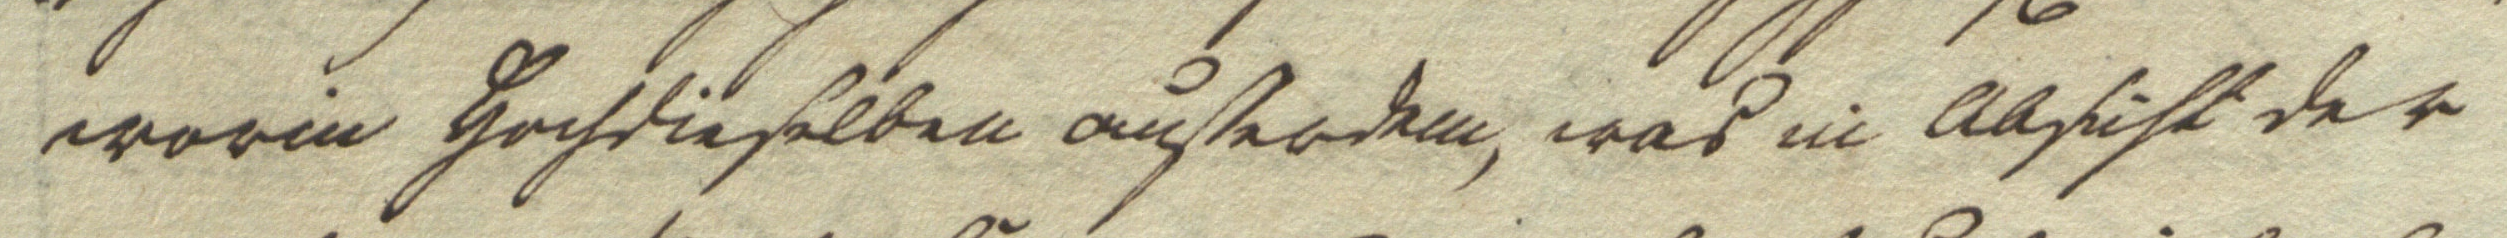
worin Hochdieselben ausserdem, was in Absicht der
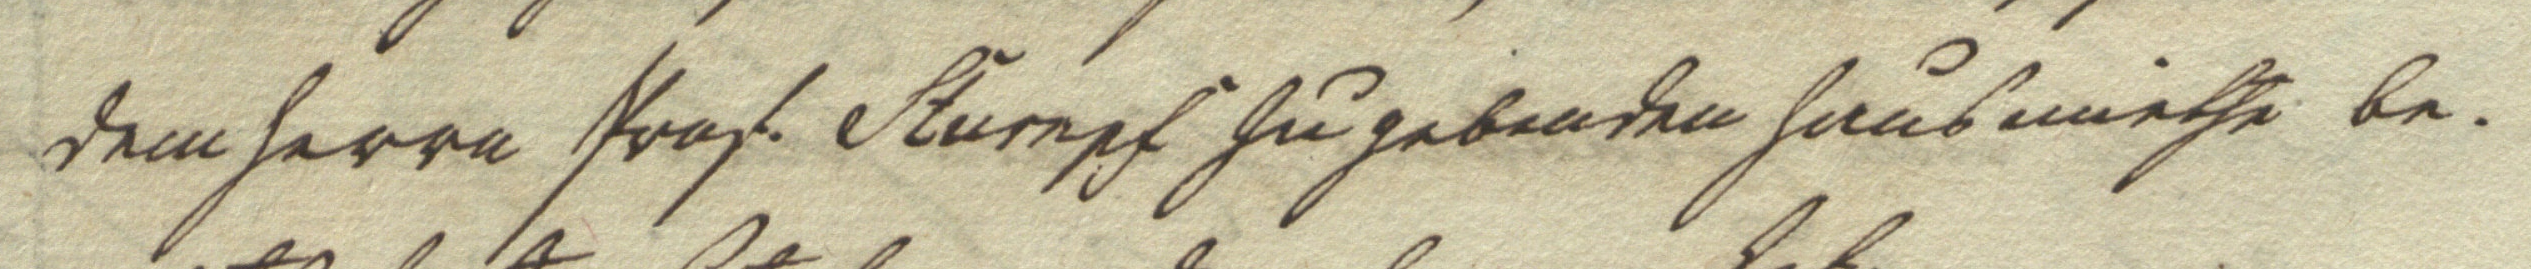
dem Herrn Prof. Stumpf zu gebenden Hausmiethe be¬
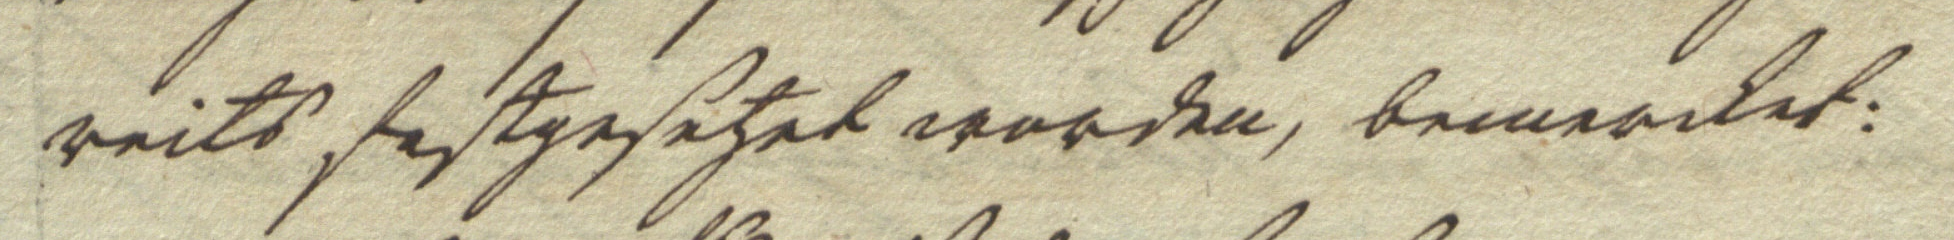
reits festgesetzet worden, bemerket:
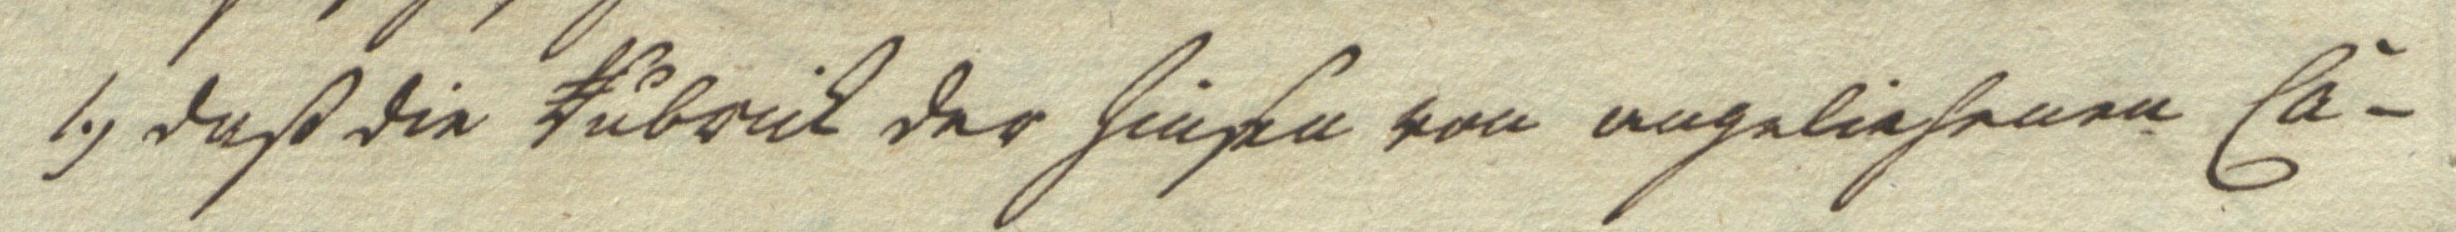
1., daß die Rubrik der Zinsen von angeliehenen Ca¬
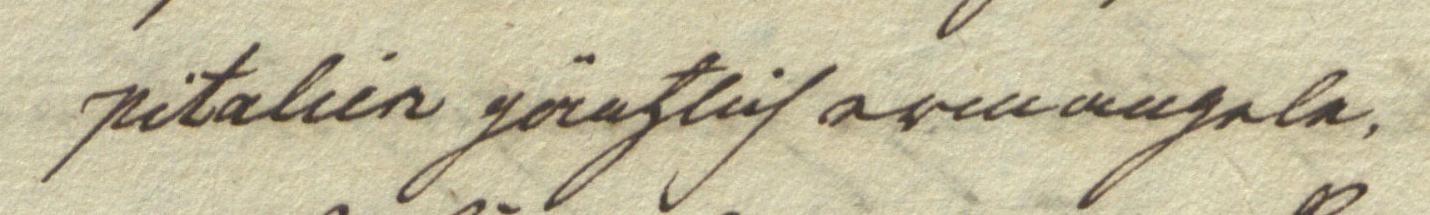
pitalien gäntzlich ermangele,
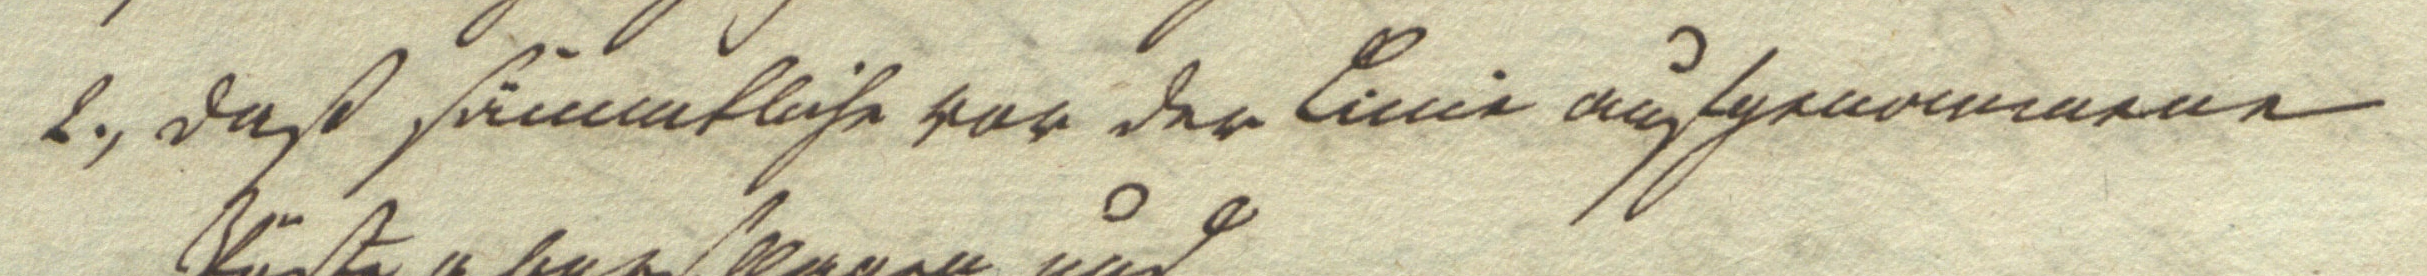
2., daß sämtliche vor der Linie aufgenommene
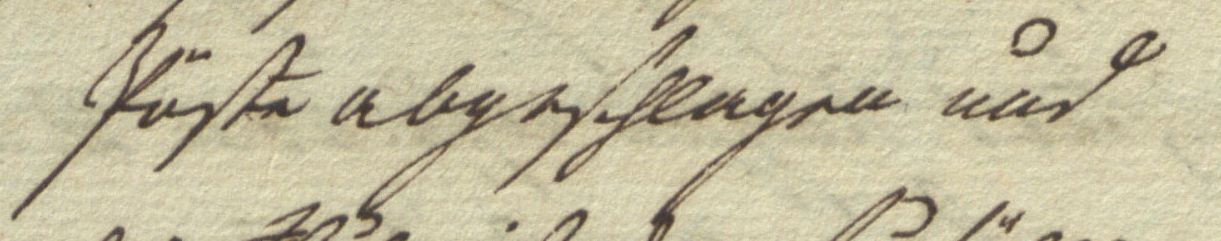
Pöste abegeschlagen und
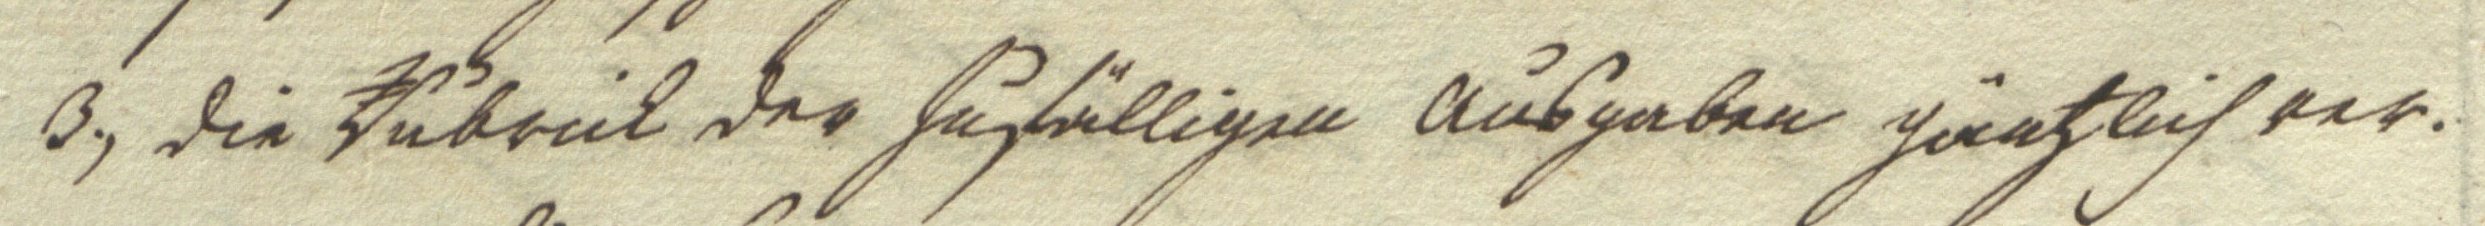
3., die Rubrik der zufälligen Ausgaben gäntzlich ver¬
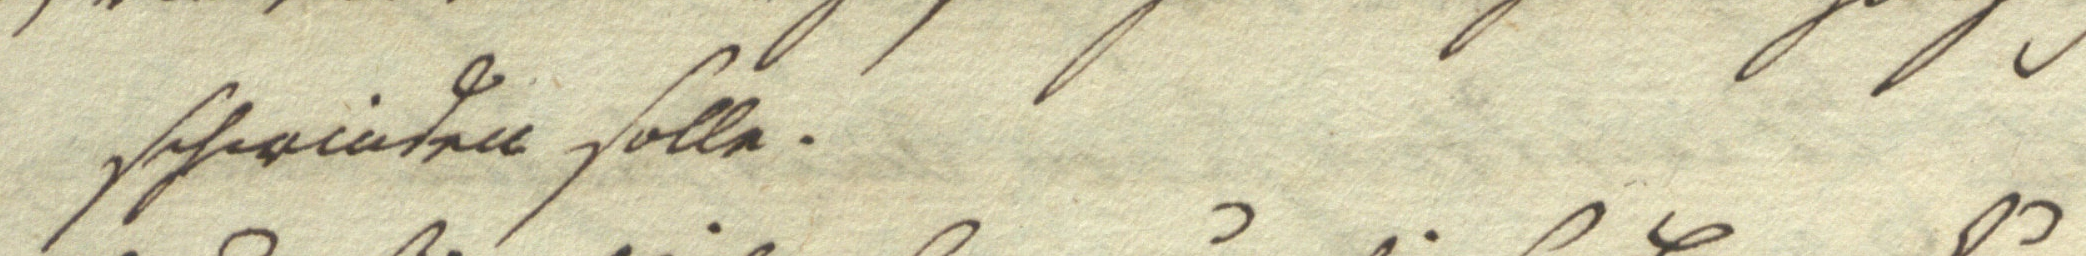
schwinden solle.
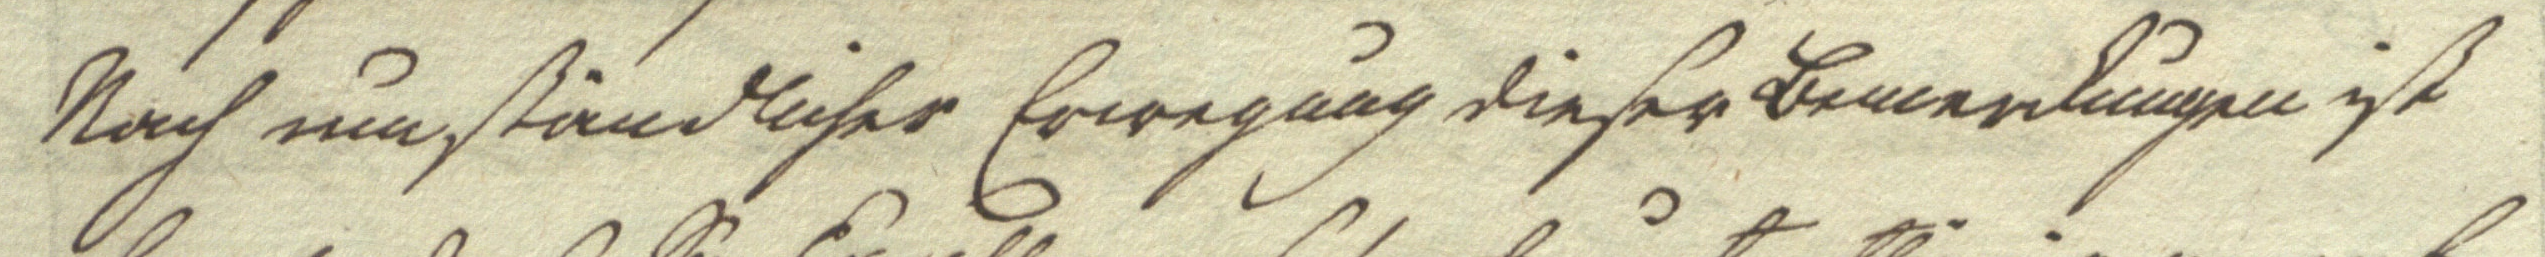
Nach umständlicher Erwegung dieser Bemerkungen ist
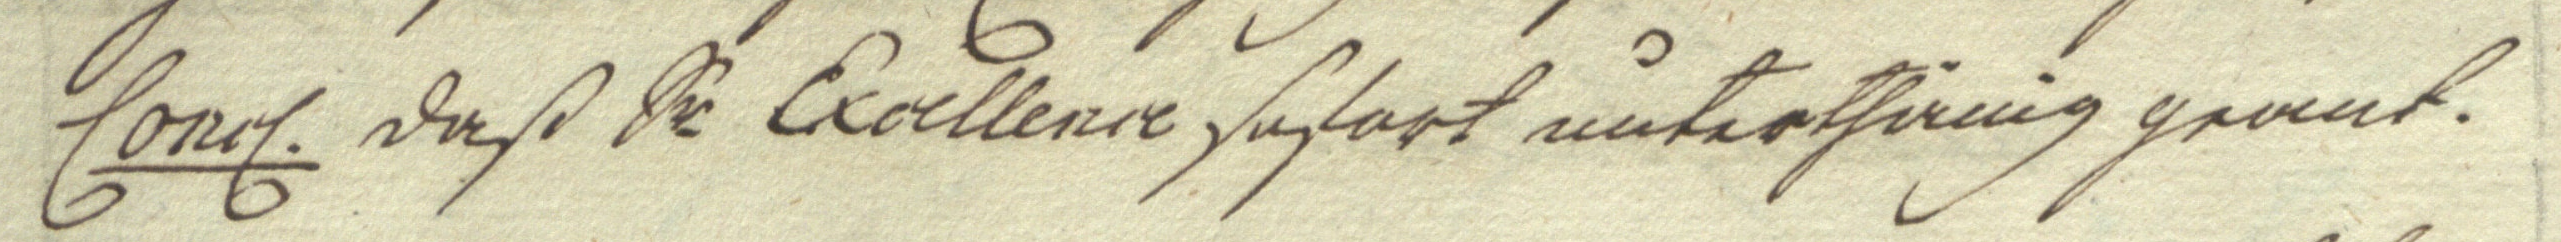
Concl. daß Sr. Excellence sofort unterthänig geant¬
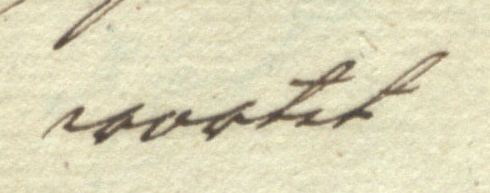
wortet
